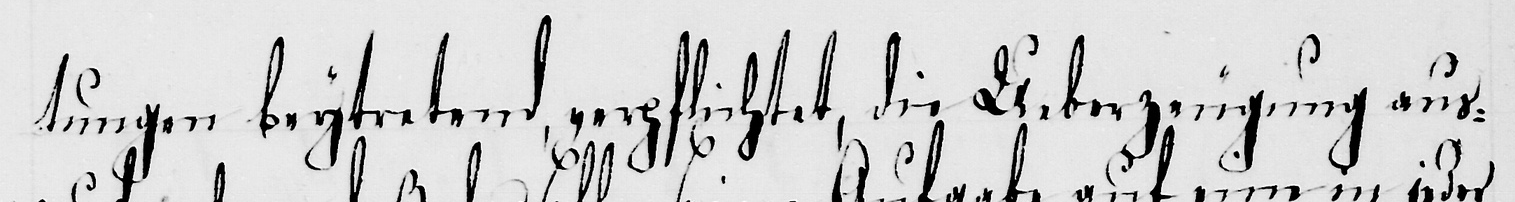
tungen beytretend, verpflichtet, die Ueberzeugung aus¬
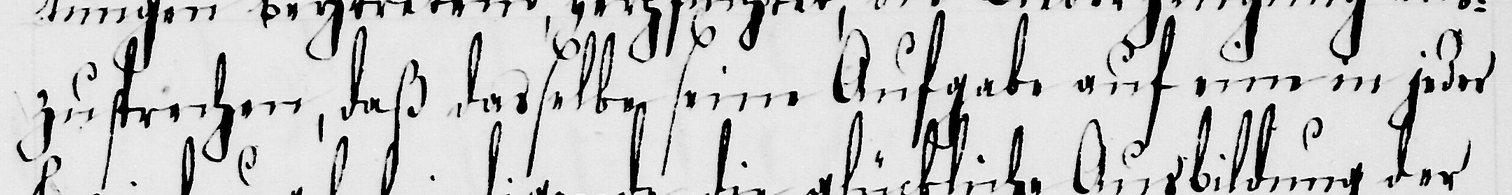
zusprechen, daß dasselbe seine Aufgabe auf eine in jeder
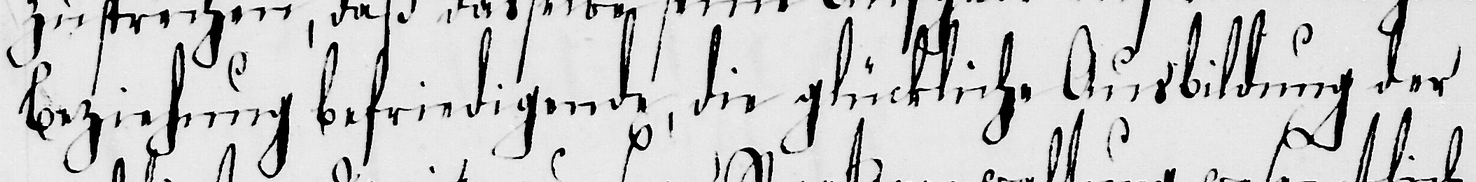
Beziehung befriedigende, die glückliche Ausbildung der
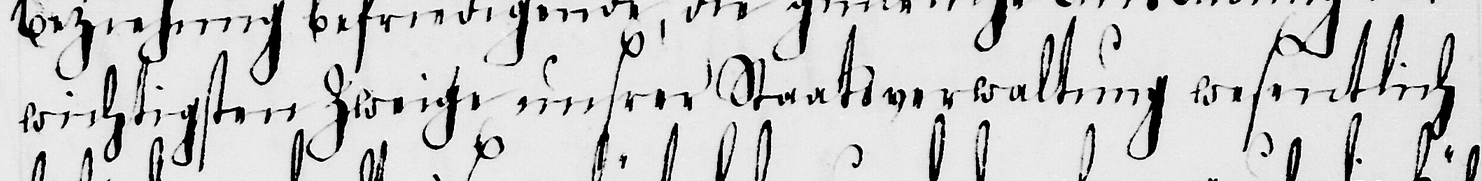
wichtigsten Zweige unsrer Staatsverwaltung wesentlich
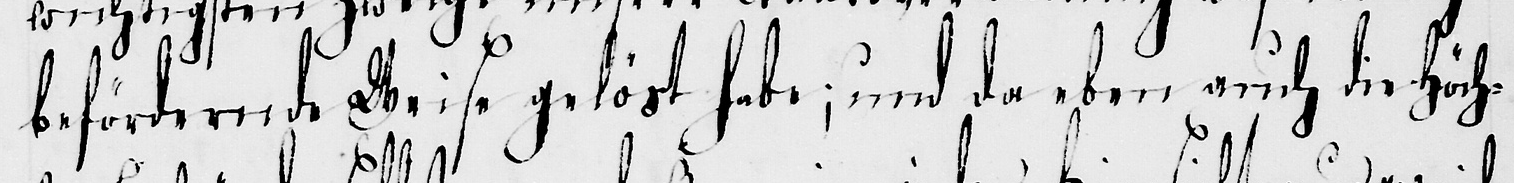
befördernde Weise gelöst habe; und da eben auch die Höch¬
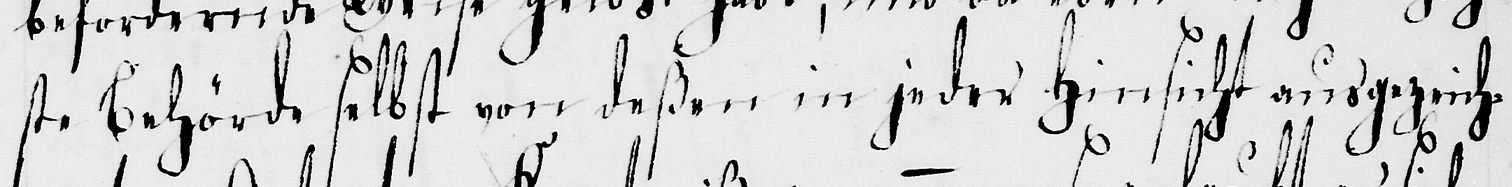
ste Behörde selbst von deßen in jeder Hinsicht ausgezeic¬
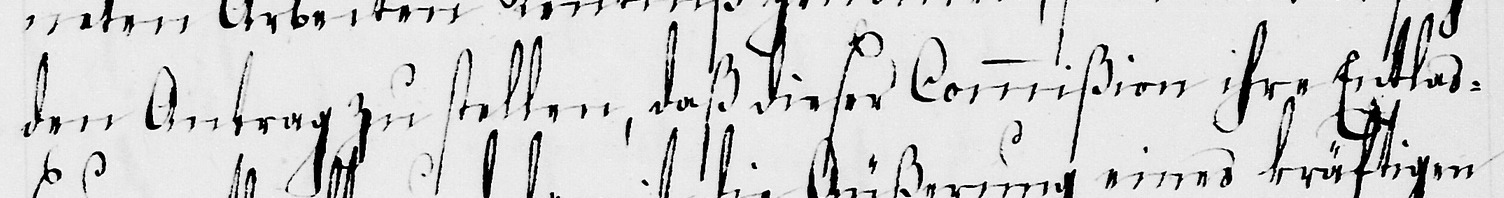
den Antrag zu stellen, daß dieser Commißion ihre Entlaß¬
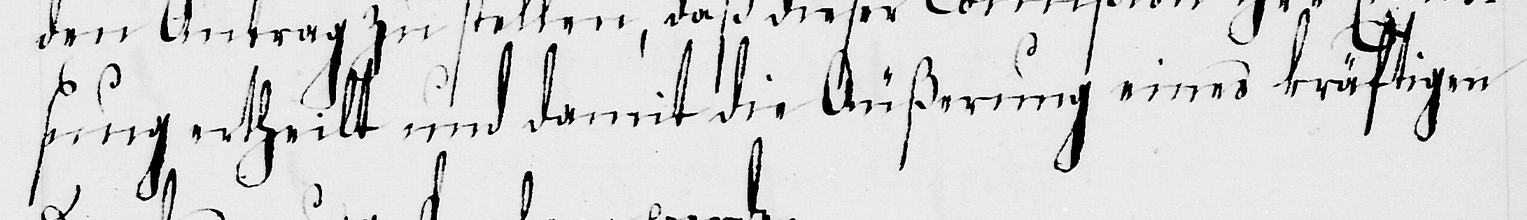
ung ertheilt und damit die Äußerung eines kräftigen
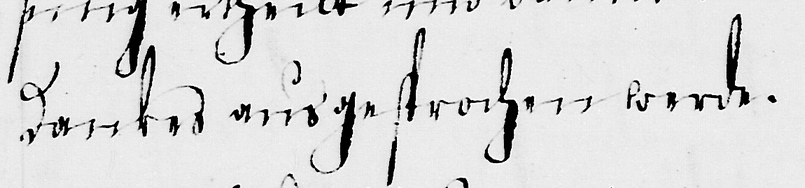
Dankes ausgesprochen werde.
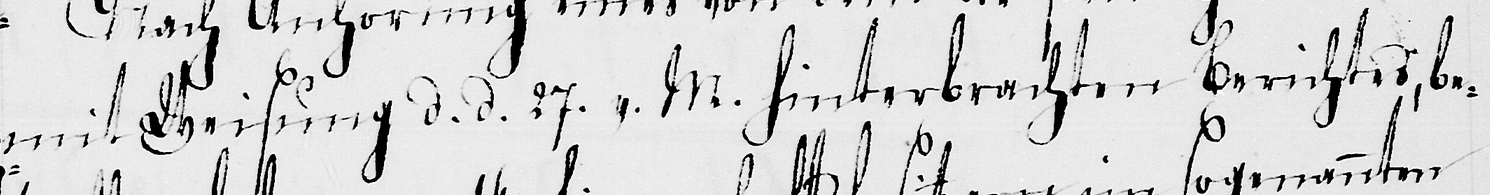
mit Weisung d. d. 27. v. M. hinterbrachten Berichtes, b¬
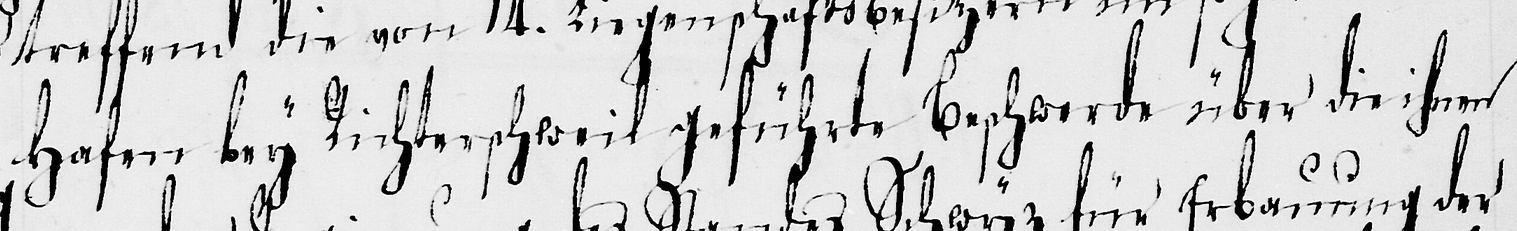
Hafen bey Richterschweil geführte Beschwerde über die ihnen
